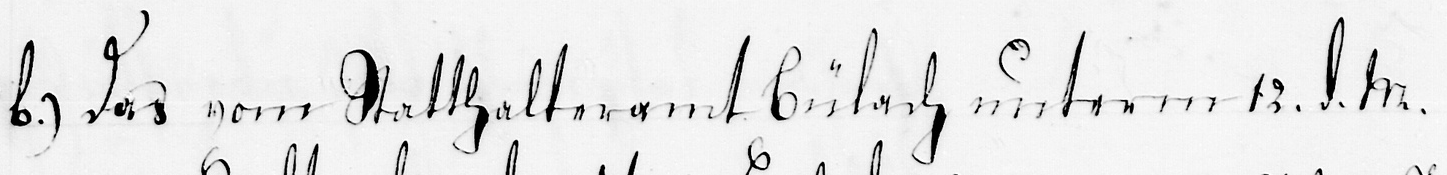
b.) Das vom Statthalteramt Bülach untern 12. d. M.
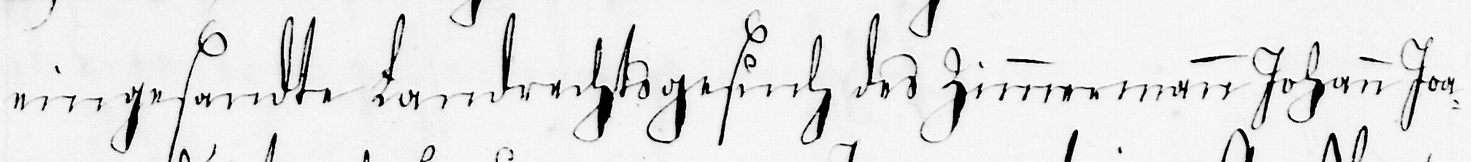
eingesandte Landrechtsgesuch des Zimmermann Johann Jo¬
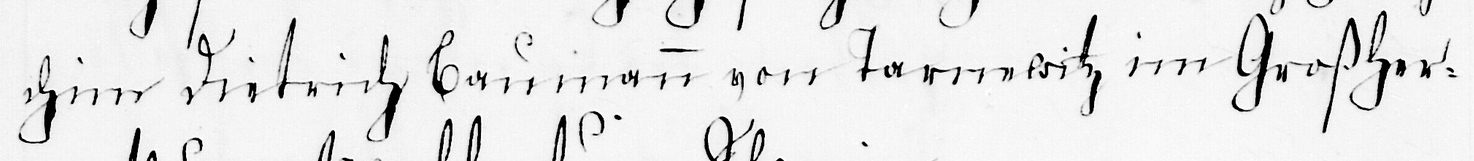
achim Dietrich Baumann von Tarnewitz im Großher¬
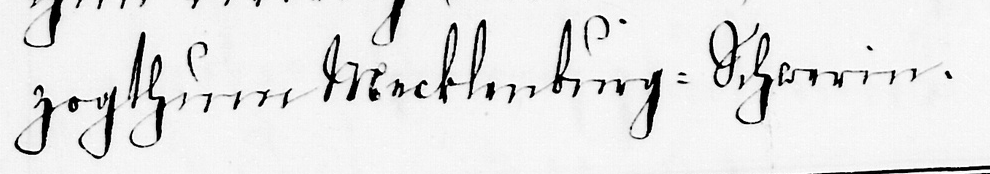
zogthum Mecklenburg-Schwerin.
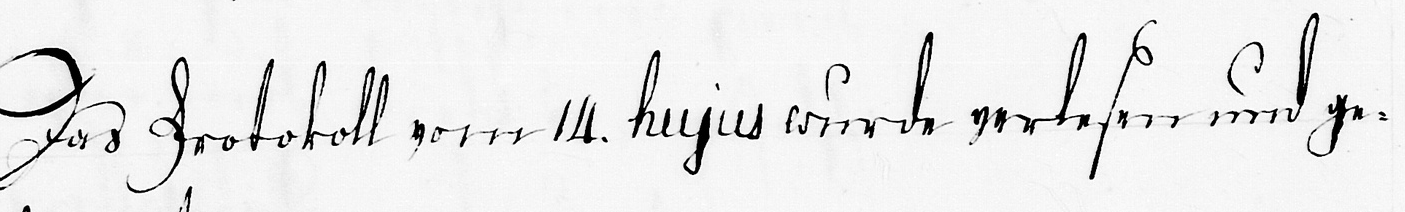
Das Protokoll vom 14. hujus wurde verlesen und ge¬
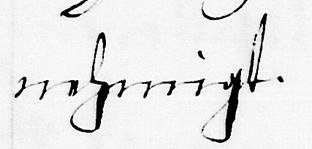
nehmigt.
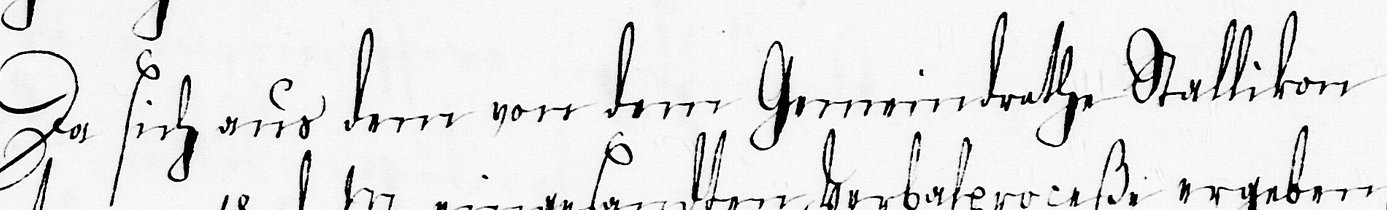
Da sich aus dem von dem Gemeindrathe Stallikon
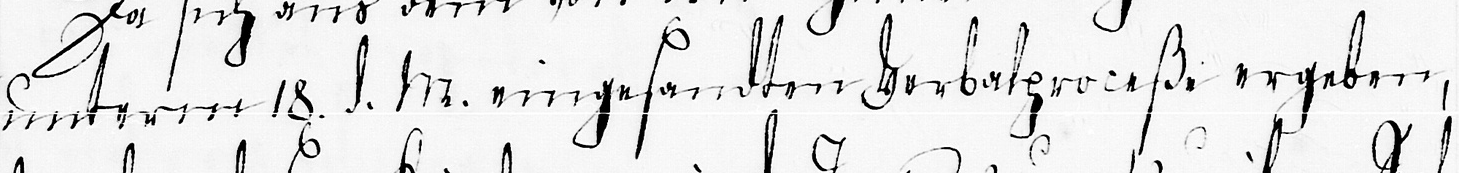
unterm 18. d. M. eingesandten Verbalproceße ergeben,
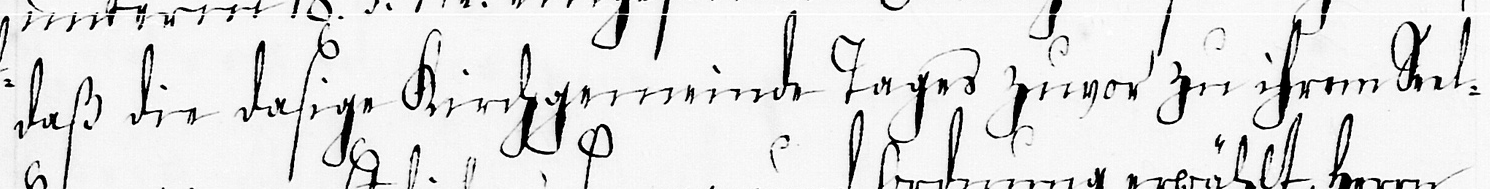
daß die dasige Kirchgemeinde Tages zuvor zu ihrem Seel¬
